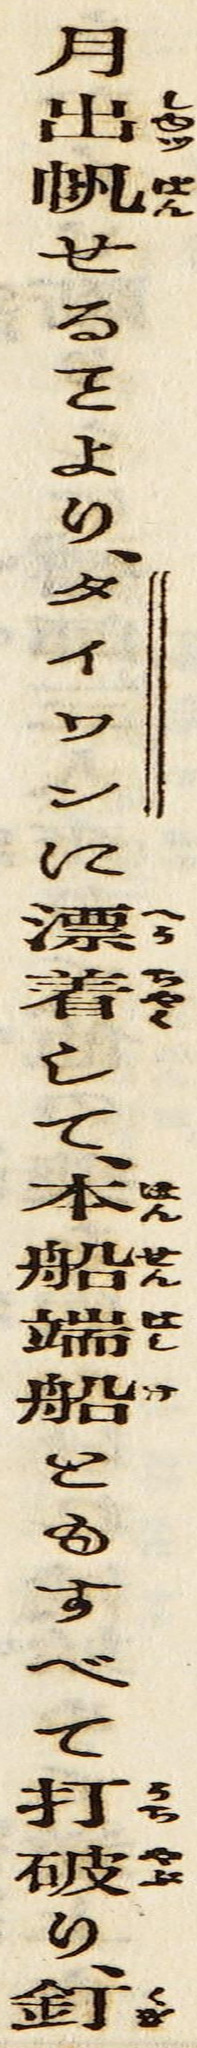月出帆せることより、タイワンに漂着して、本船端船ともすべて打破り、釘
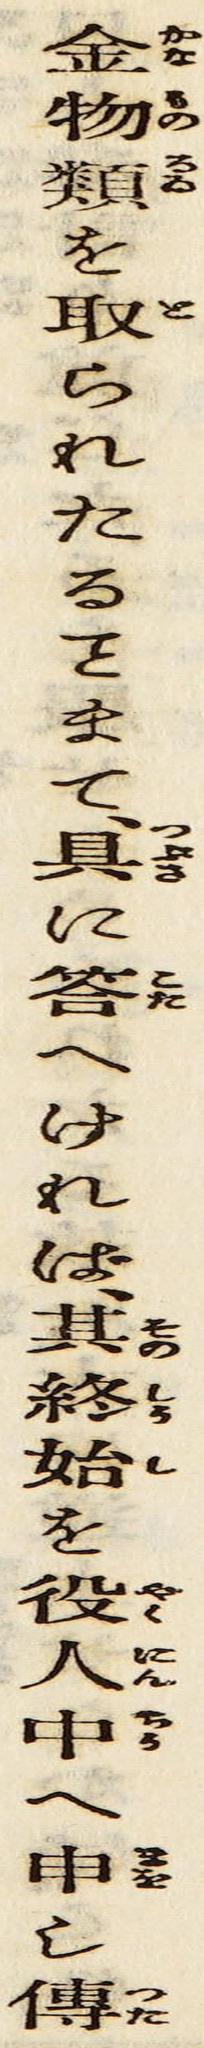金物類を取られたることまて、具に答へければ、其終始を役人中へ申し伝
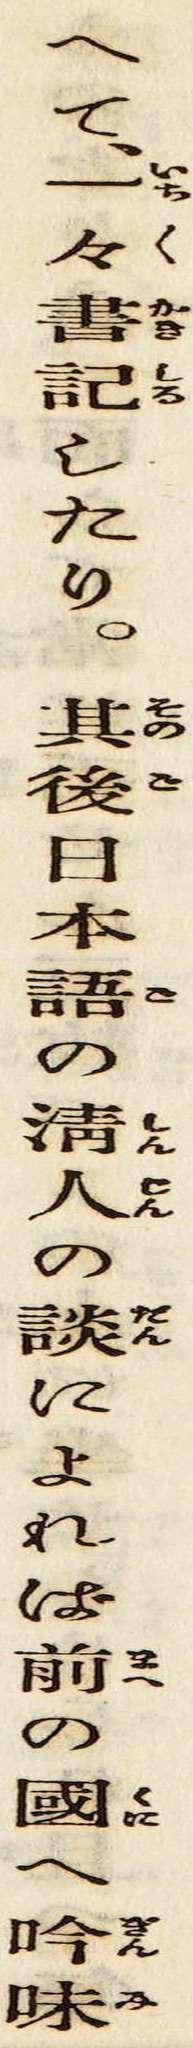へて、一々書記したり。其後日本語の清人の談によれば前の国へ吟味
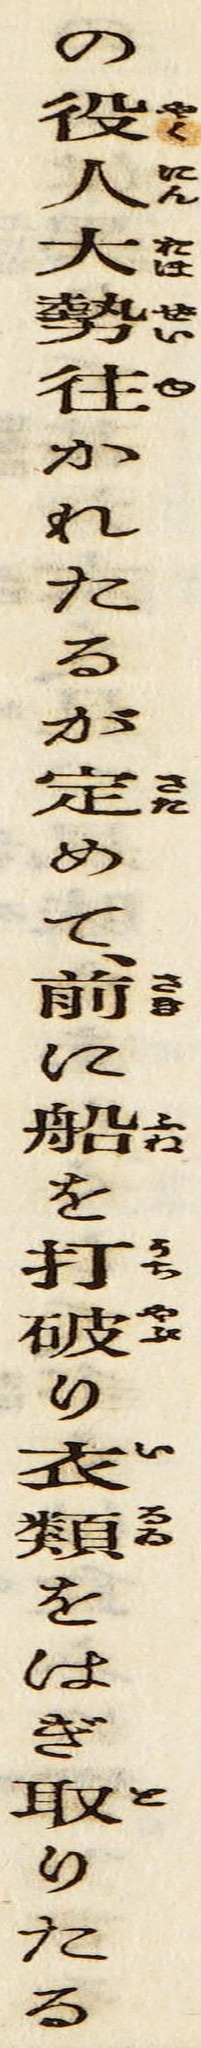の役人大勢往かれたるが定めて、前に船を打破り衣類をはぎ取りたる
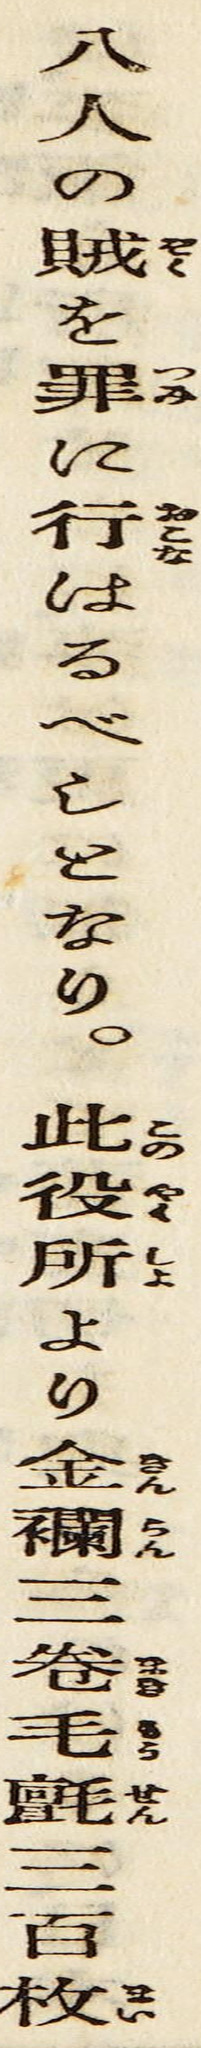八人の賊を罪に行はるべしとなり。此役所より金襴三巻毛氈三百枚
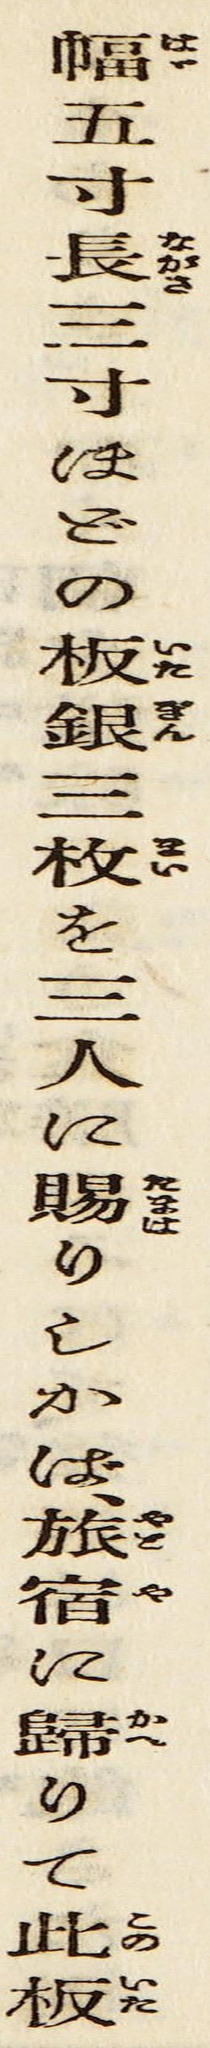幅五寸長三寸ほどの板銀三枚を三人に賜りしかば、旅宿に帰りて此板
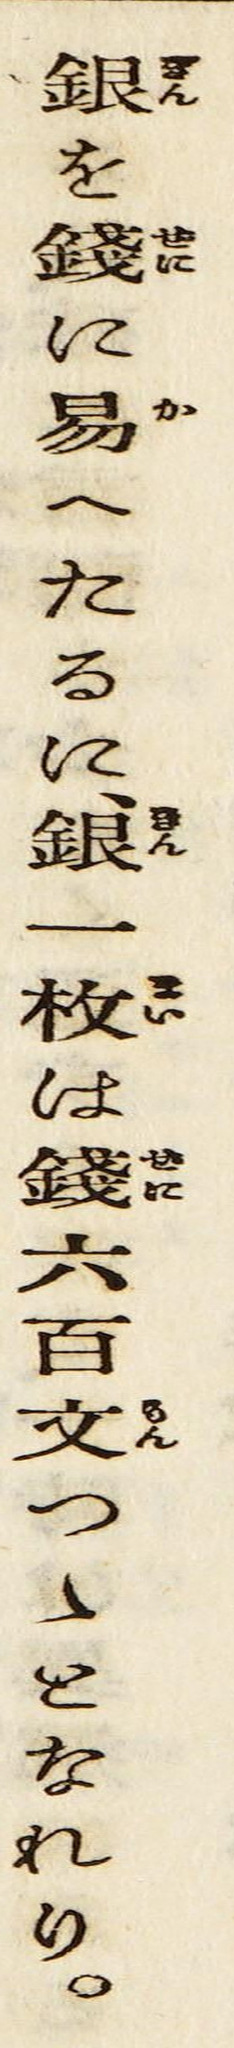銀を銭に易へたるに、銀一枚は銭六百文つゝとなれり。
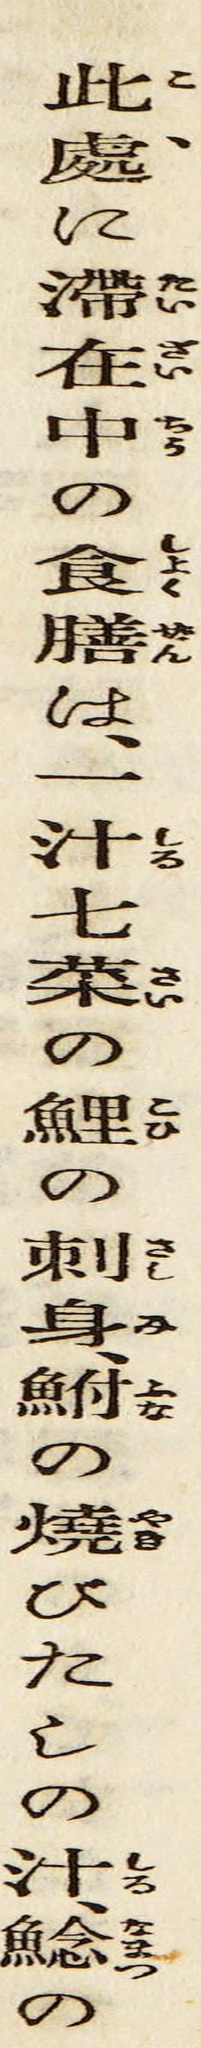此処に滞在中の食膳は、一汁七菜の鯉の刺身、鮒の焼びたしの汁、鯰の
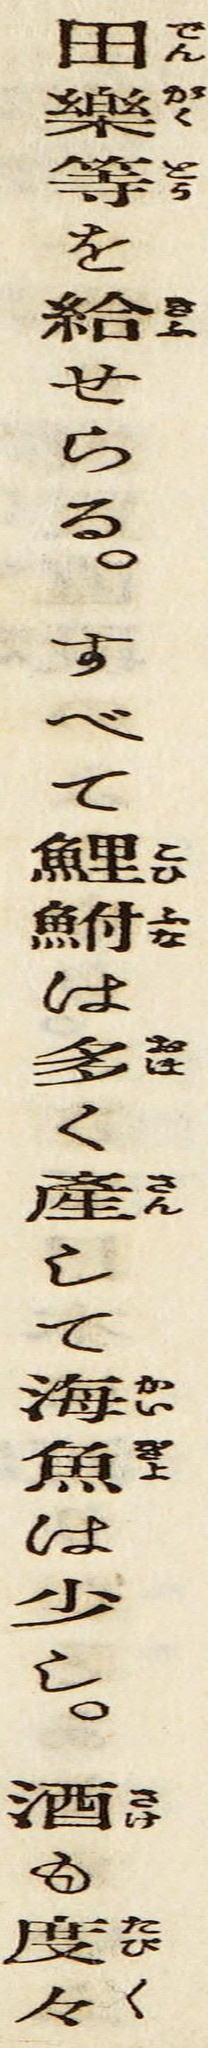田楽等を給せらる。すべて鯉鮒は多く産して海魚は少し。酒も度々
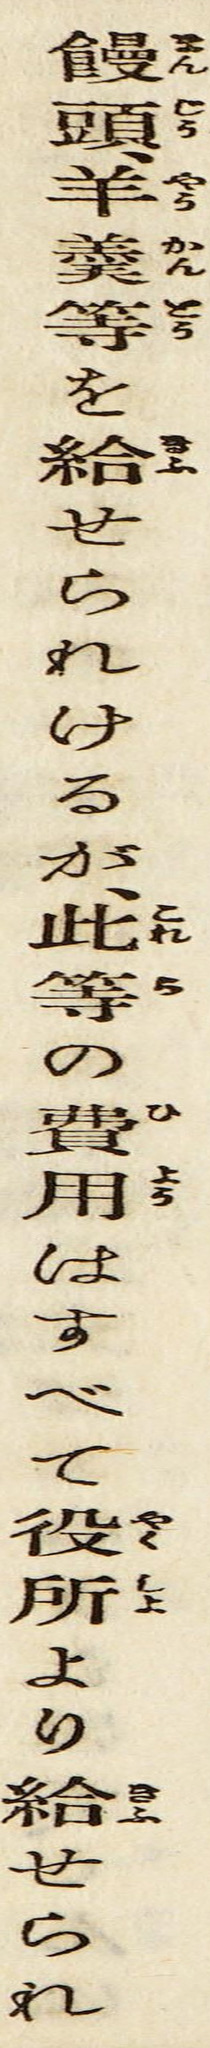饅頭、羊羹等を給せられけるが、此等の費用はすべて役所より給せられ

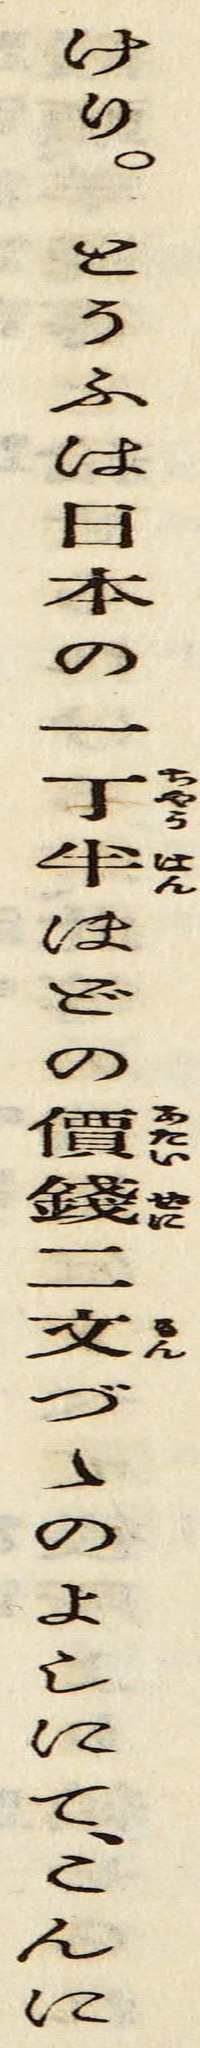けり。とうふは日本の一丁半ほどの価銭二文づゝのよしにて、こんに
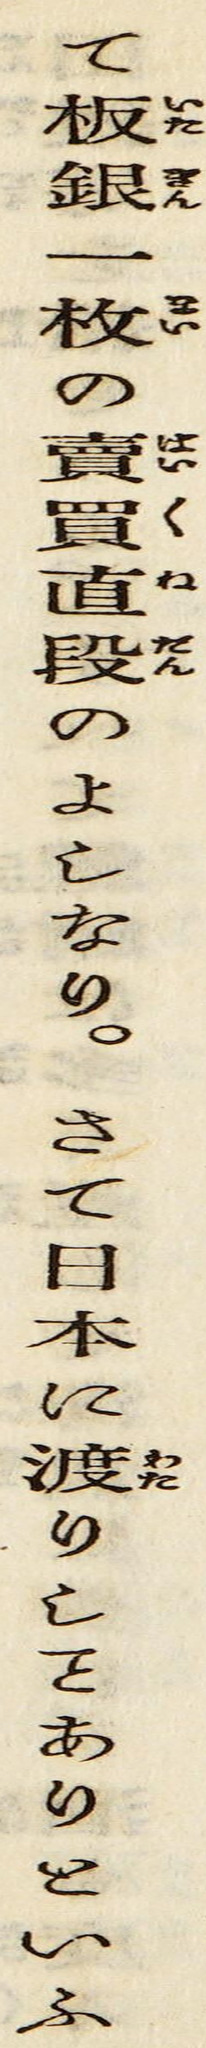て板銀一枚の売買値段のよしなり。さて日本に渡りしことありといふ
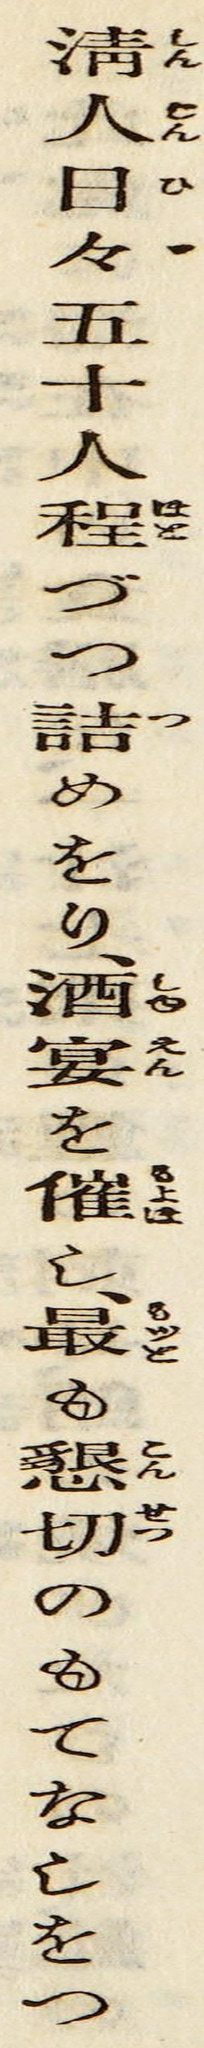清人日々五十人程づつ詰めをり、酒宴を催し、最も懇切のもてなしをつ
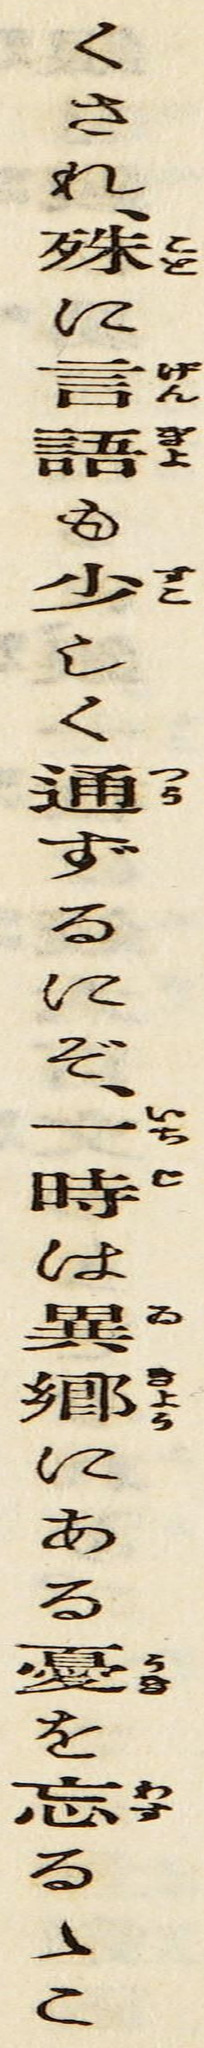くされ、殊に言語も少しく通ずるにぞ、一時は異郷にある憂を忘るゝこ
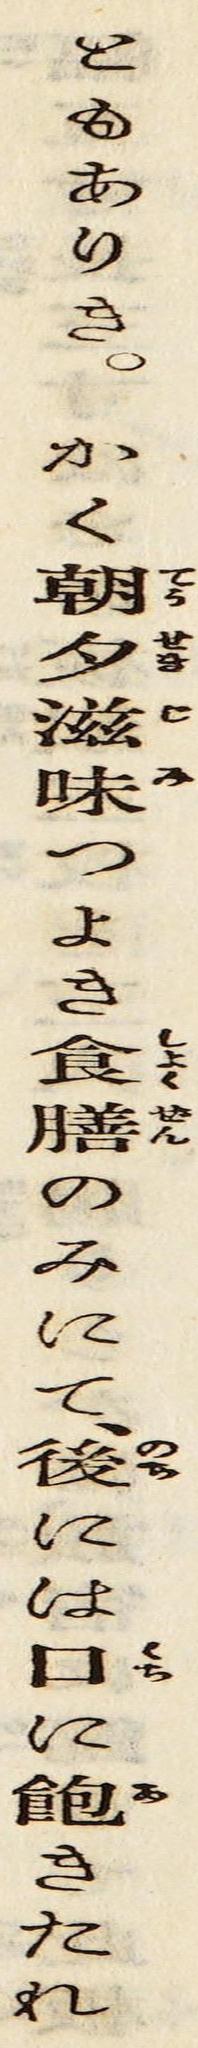ともありき。かく朝夕滋味つよき食膳のみにて、後には口に飽きたれ
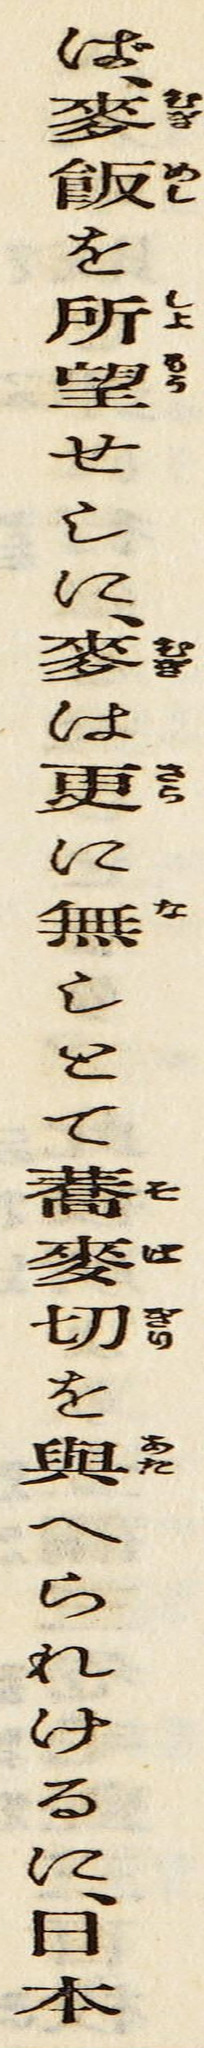ば、麦飯を所望せしに、麦は更に無しとて蕎麦切を与へられけるに、日本
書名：日本漂流譚
